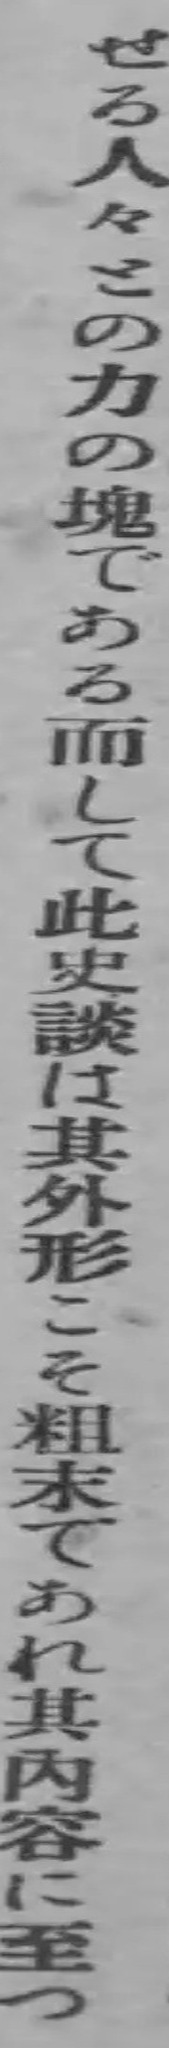せる人々との力の塊である而して此史談は其外形こそ粗末であれ其内容に至つ
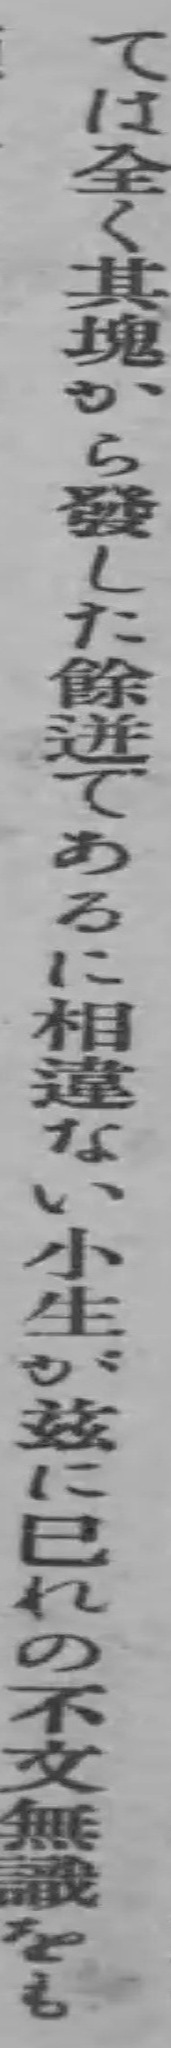ては全く其塊から発した余迸であるに相違ない小生が茲に巳れの不文無識をも
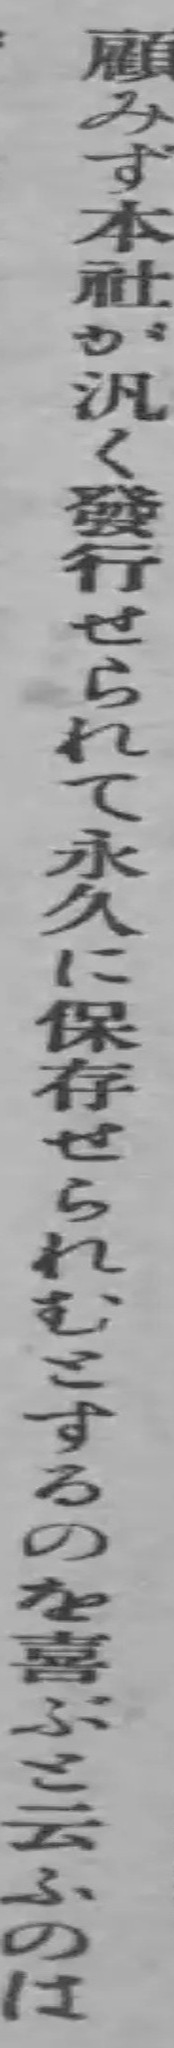顧みず本社が汎く発行せられて永久に保存せられむとするのを喜ぶと云ふのは
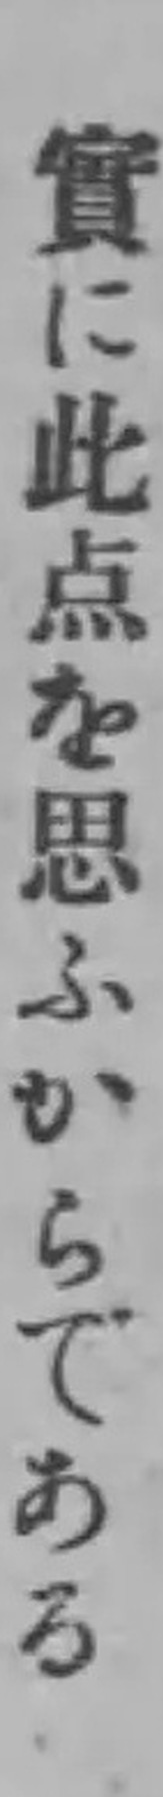実にこの此点を思ふからである
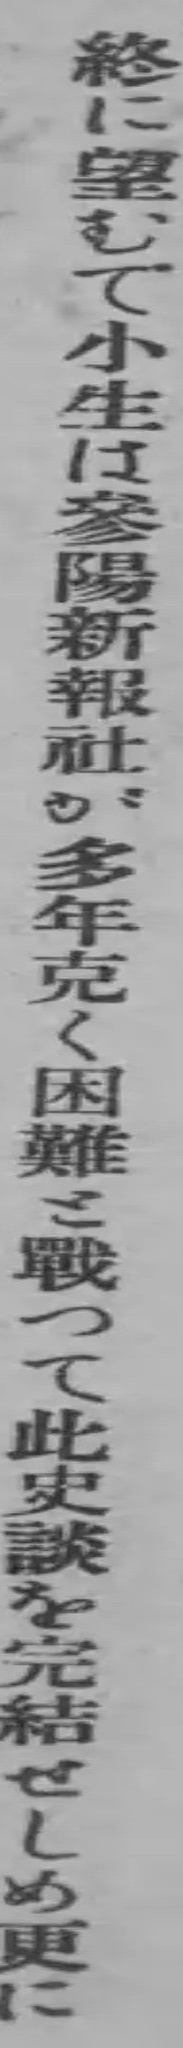終に望むでて小生は参陽新報社が多年克く困難と戦つて此史談を完結せしめ更に
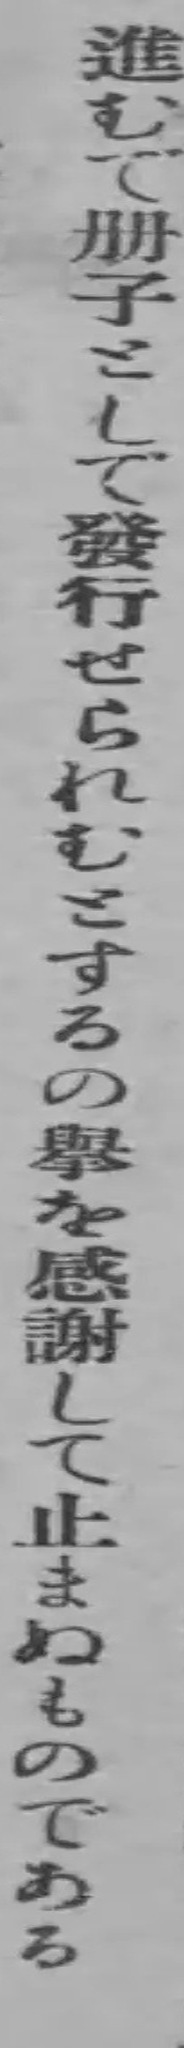進むで冊子として発行せられむとするの拳を感謝して止まぬものである
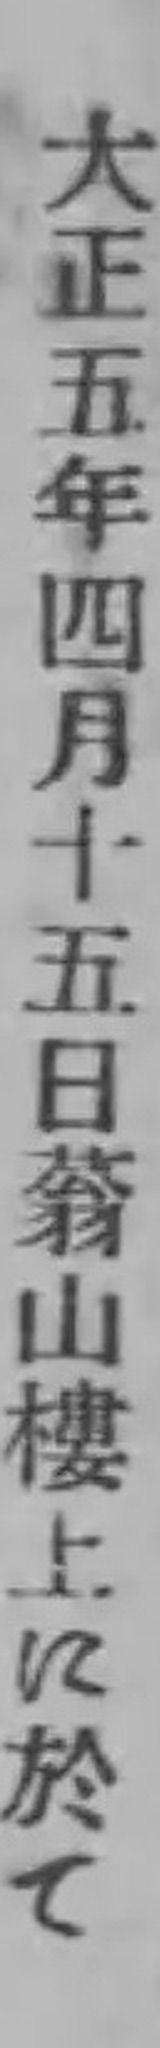大正五年四月十五日蓊山楼上に於て
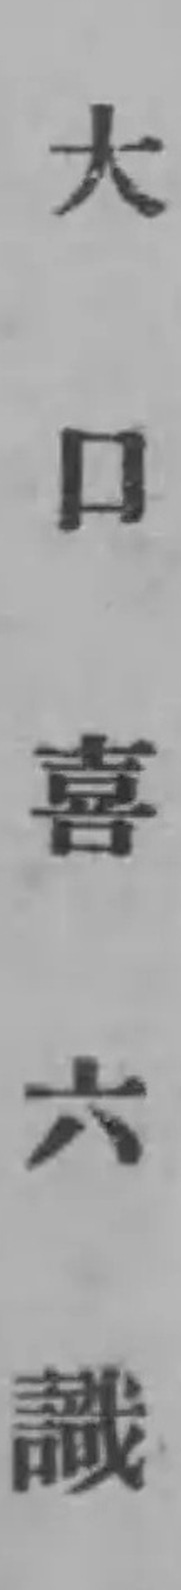大口喜六識
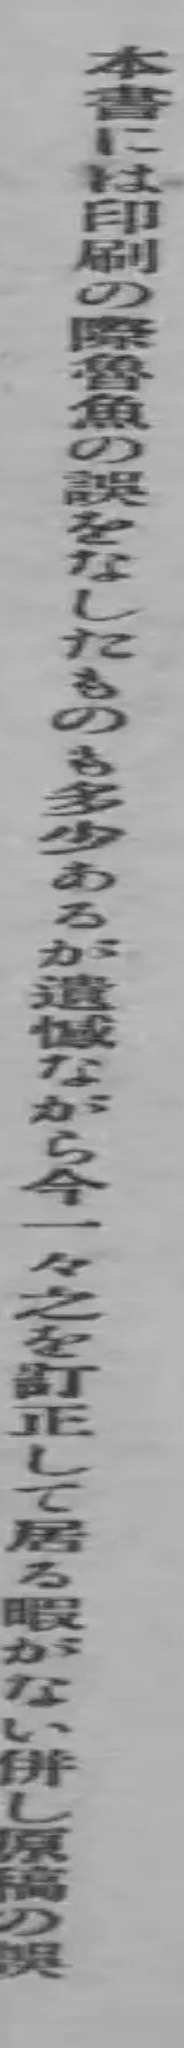本書には印刷の際魯魚の誤をなしたものも多少あるが遺憾ながら今一々之を訂正して居る暇がない併し原稿の誤
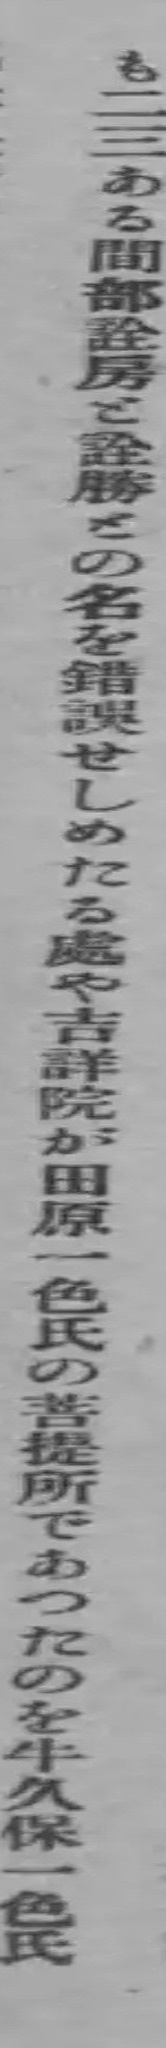もニ三ある間部詮房と詮勝との名を錯誤せしめたる処や吉祥院が田原一色氏の菩提所であつたのを牛久保一色氏
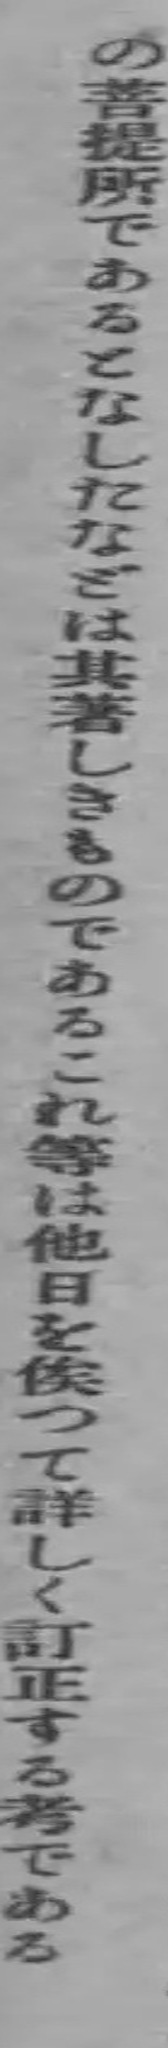の菩提所であるとなしたなどは其著しきものであるこれ等は他日を俟つて詳しく訂正する考である

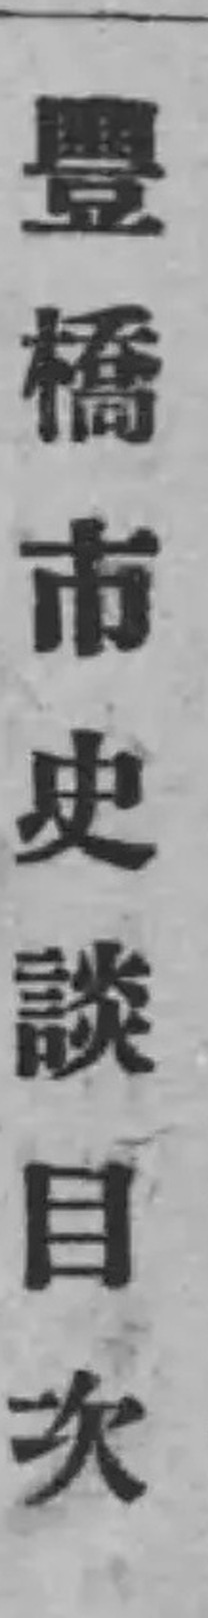豊橋市史談目次
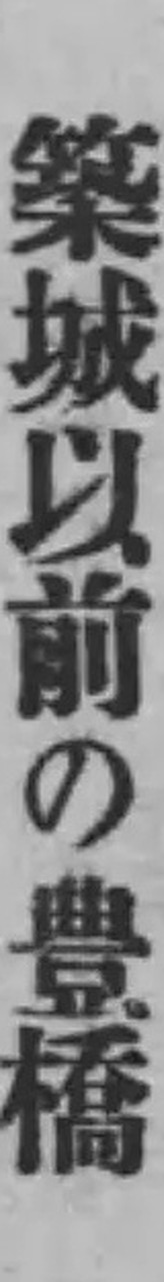築城以前の豊橋
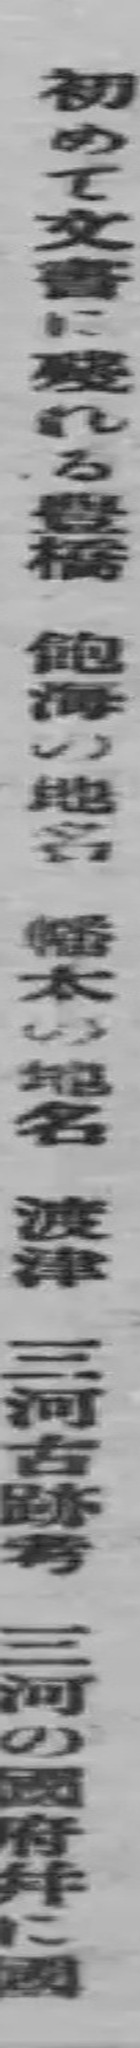初めて文書に残れる豊橋飽海の地名幡太の地名渡津三河古跡考三河の国府幷に国
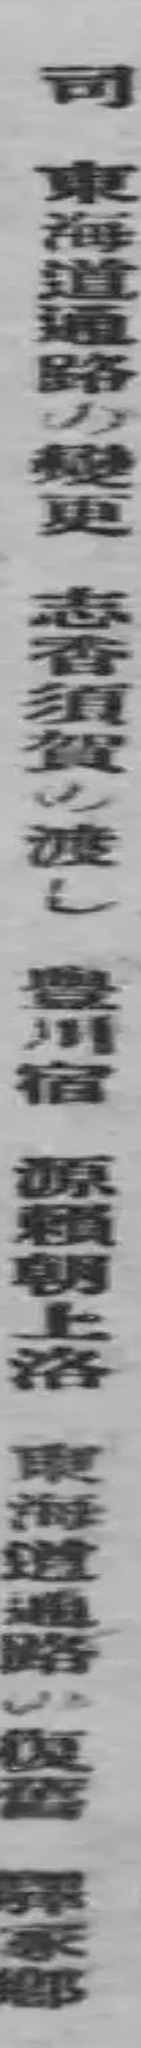司東海道通路の変更志香須賀の渡し豊川宿源頼朝上洛東海道通路の復旧駅家郷
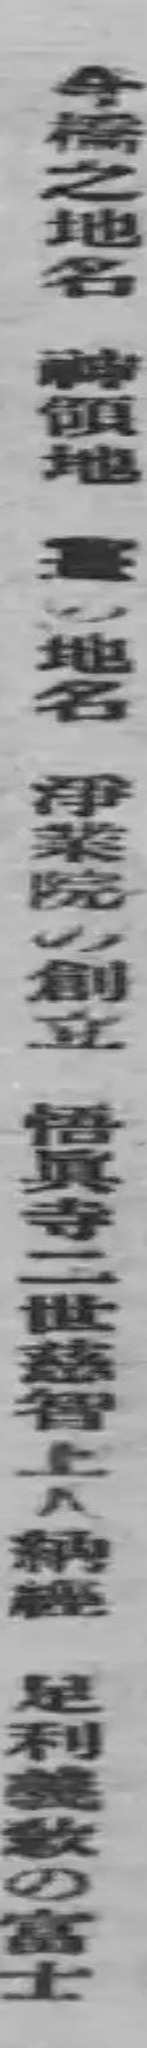今橋之地名神領地薑の地名浄業院の創立悟眞寺二世慈智上人納経足利義教の富士
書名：豊橋市史談
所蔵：国立国会図書館 National Diet Library, JAPAN
